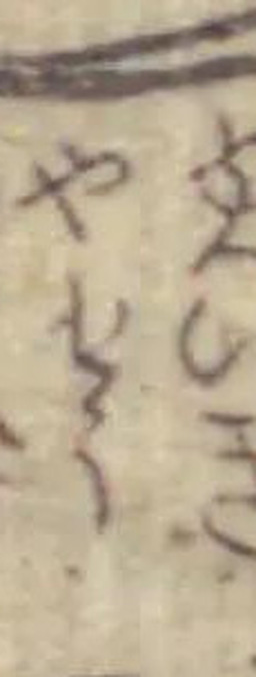やせう
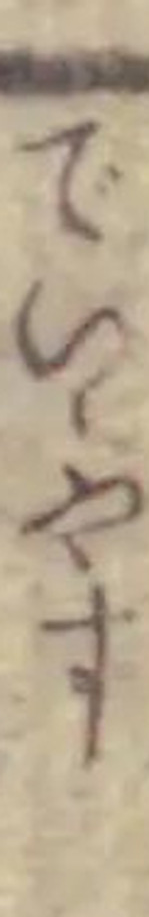でいゝやす
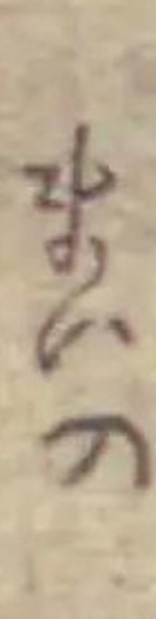まいの
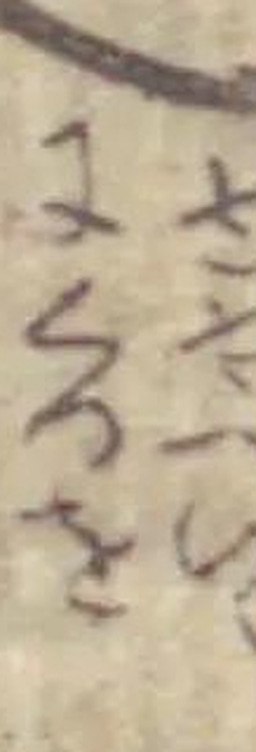にくつを
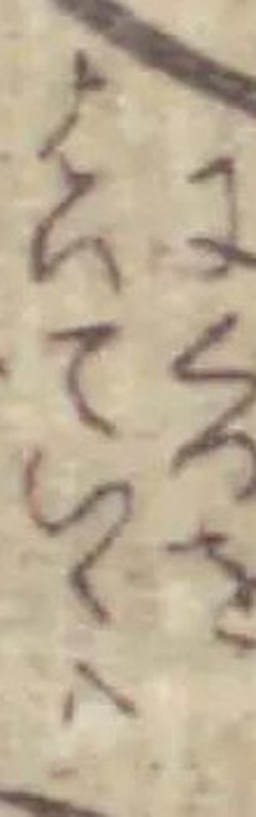はいていくは
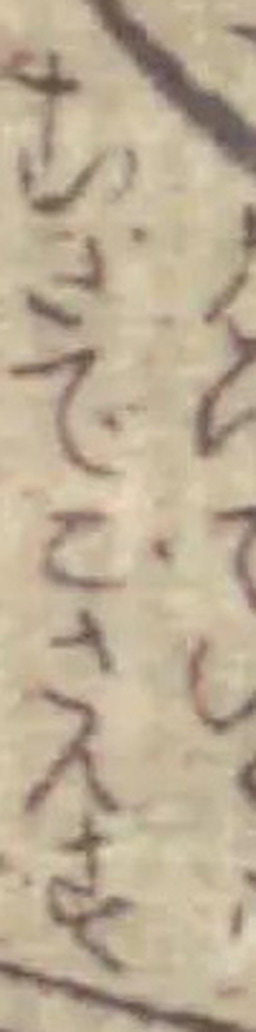むだでこさんす
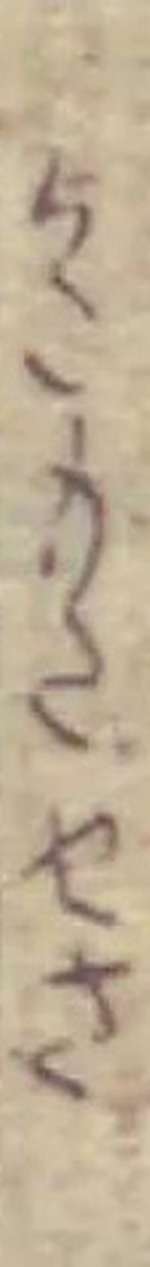かこもたせさ
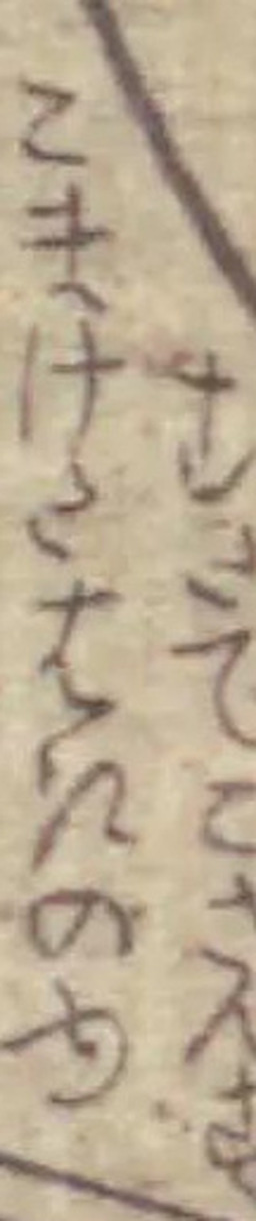こまけたはきのゆ

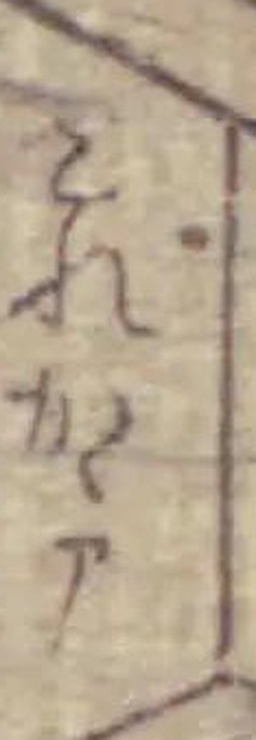これかゝア
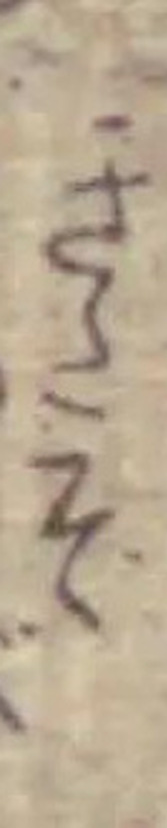きたそ
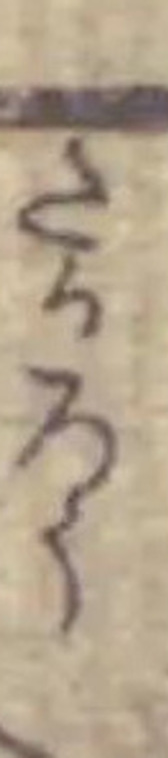たかろう
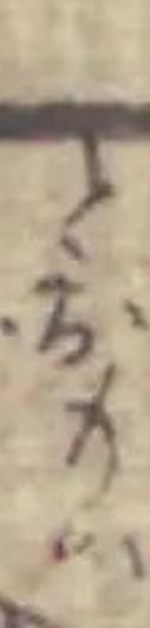とおもい
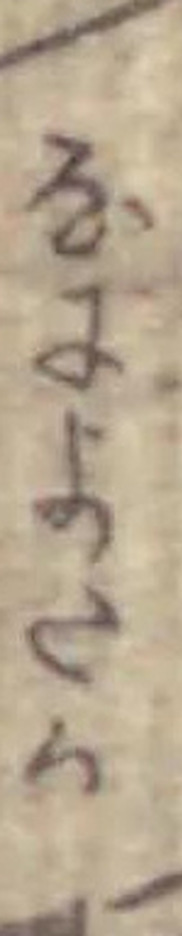なによたか
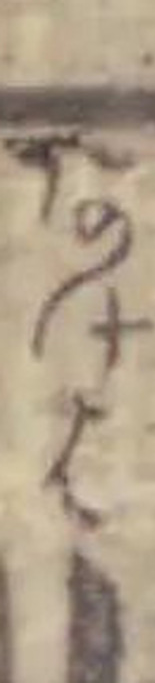あけは
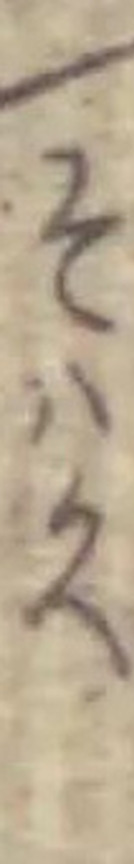そはかへ
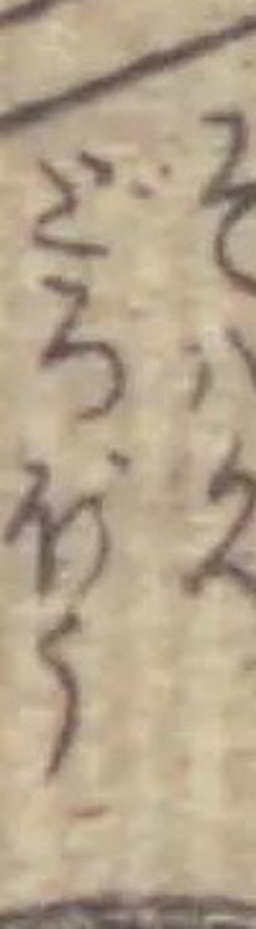どろほう
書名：茶羅毛通人 3巻
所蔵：国立国会図書館 National Diet Library, JAPAN
